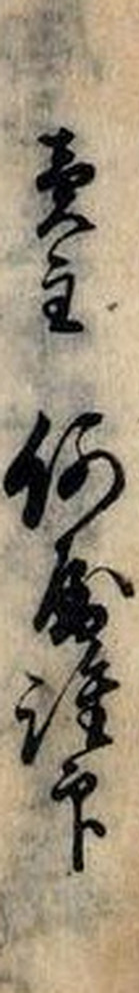賣主何屋誰印
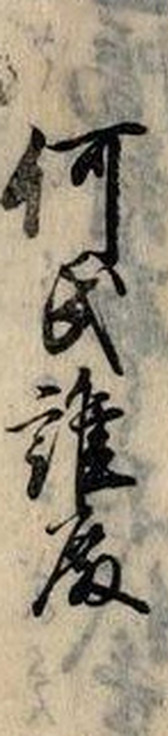何氏誰殿
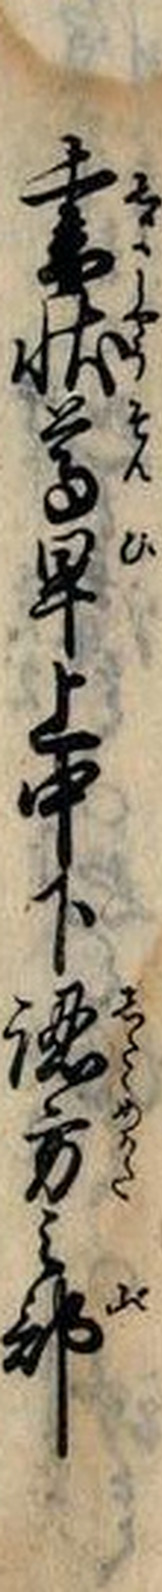書状尊卑上中下認方之部
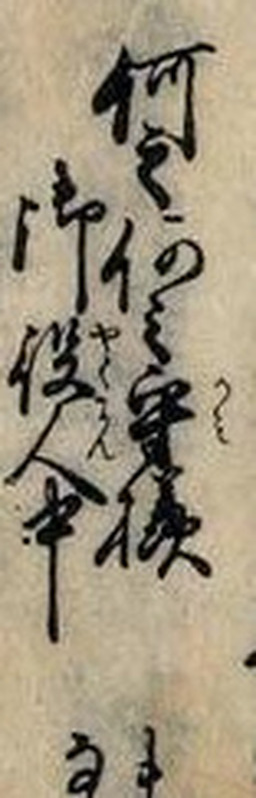御役人中
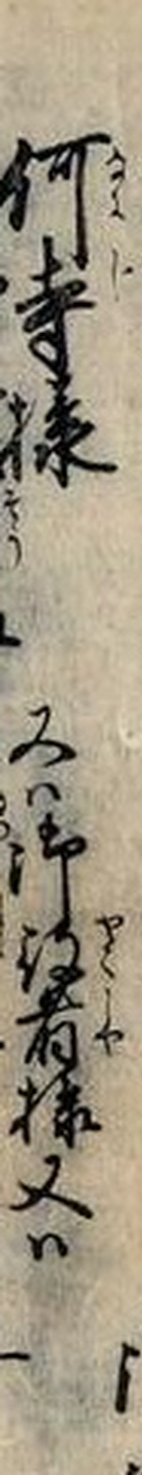何寺様又は御役者様又は
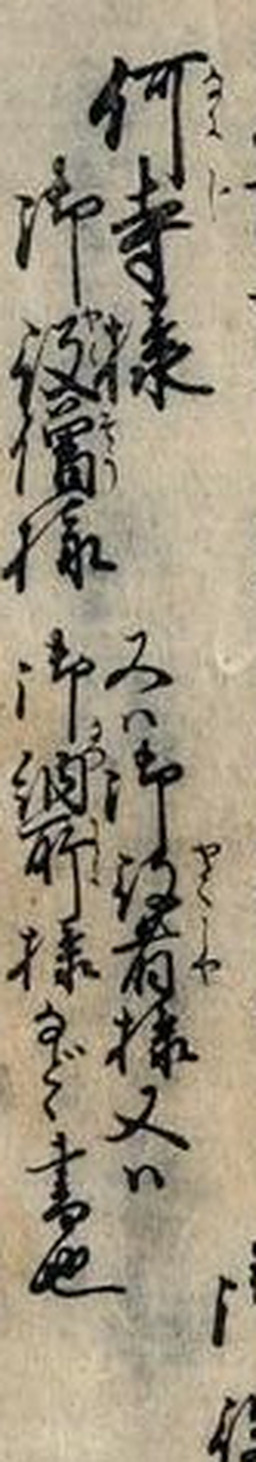御役僧様御納所様などゝ書也
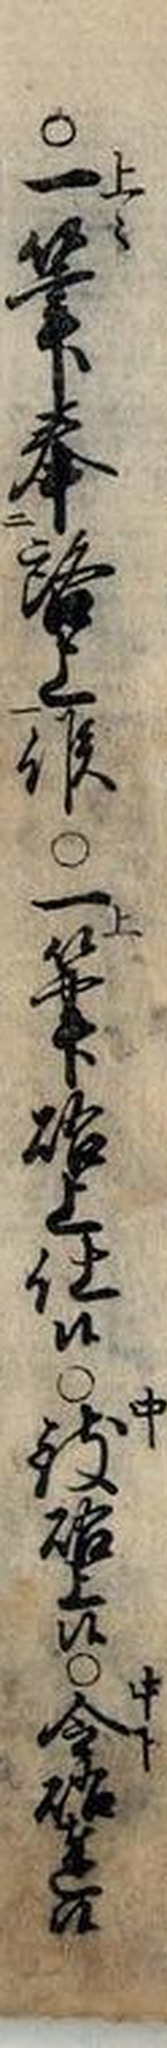○一筆奉啓上候○一筆啓上仕候○致啓上候○令啓達候
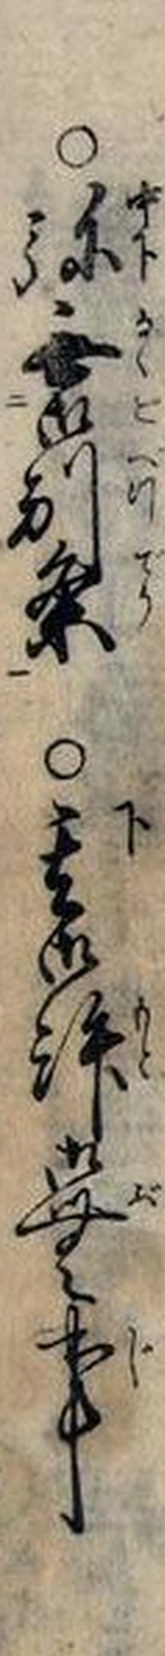○弥無御別条○其御許御無事

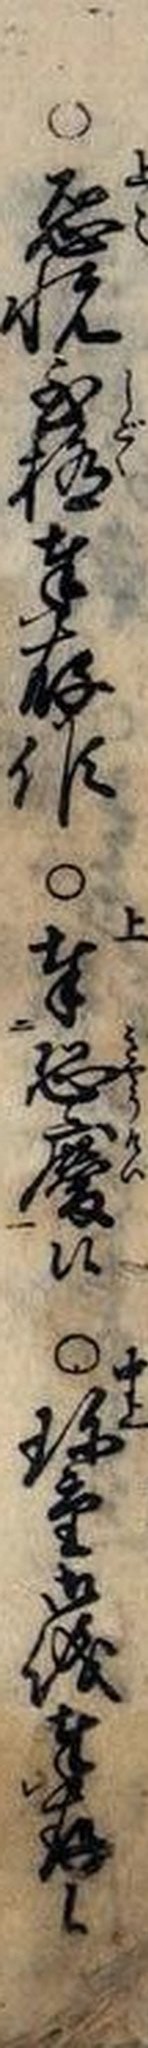○恐悦至極奉存候○奉恐慶候○珎重御儀奉存候
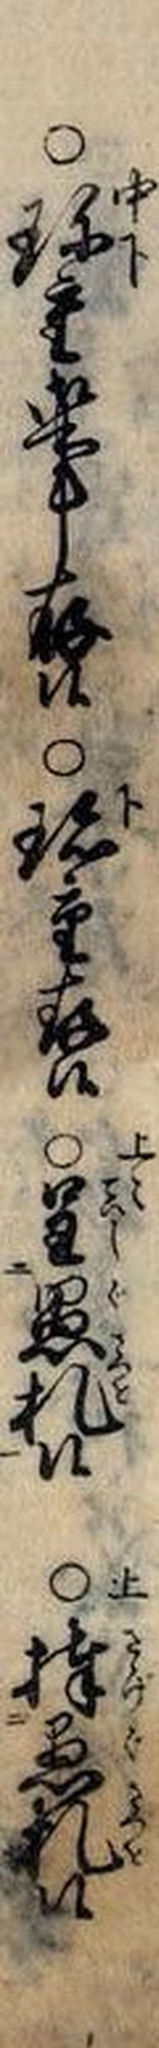○珎重御事存候○珍重存候○呈愚札候○捧愚札候
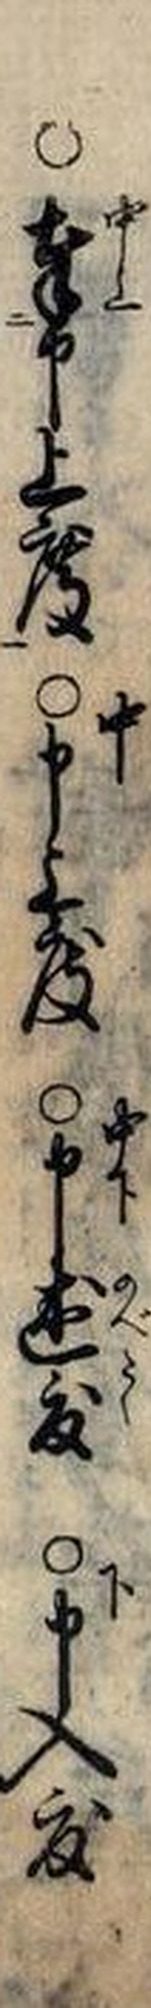○奉申上度○申上度○申述度○申入度
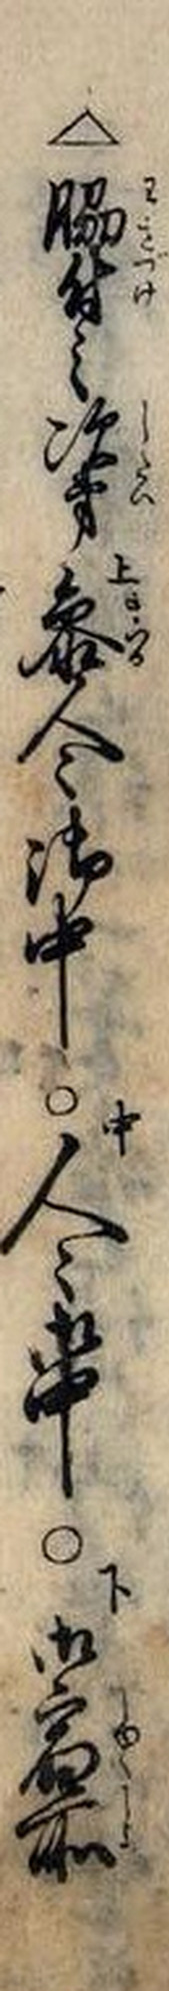△脇付之次第参人々御中○人々御中○御宿所
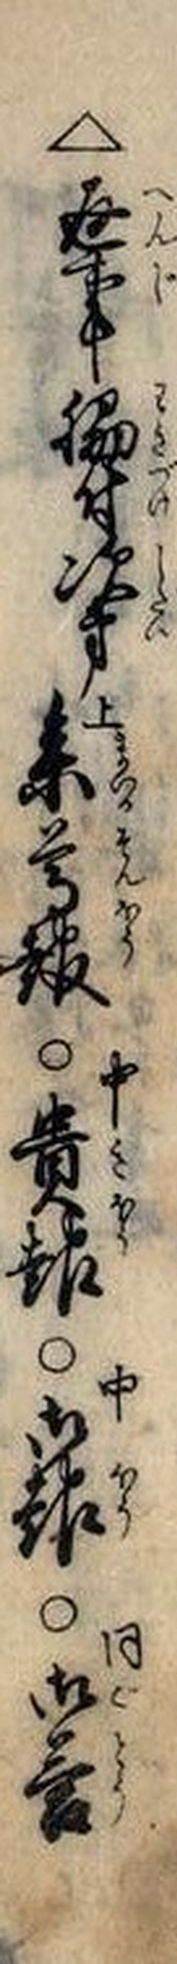△返事脇付次第参尊報○貴報○御報○御答
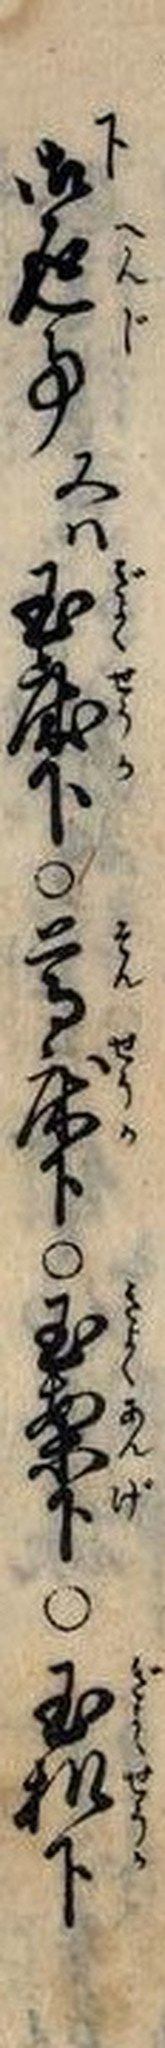御返事又は玉床下○尊床下○玉案下○玉机下
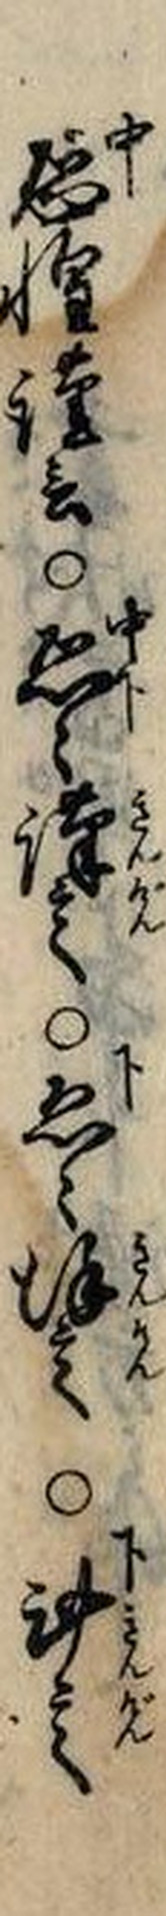恐惶謹言○恐々謹言○恐々謹言○謹言
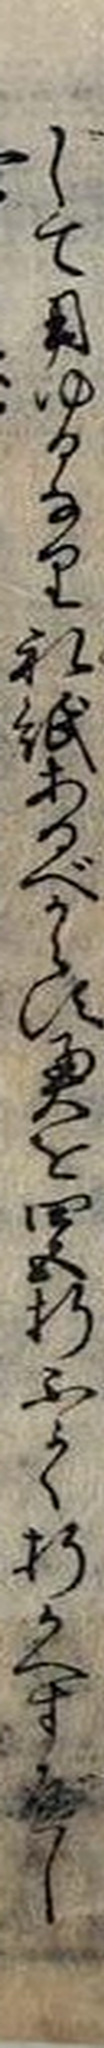して用ゆるなり礼紙あるべからす奥を四五折ふかく折かへすべし
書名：大成用文章（往来物）
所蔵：福井県文書館 Fukui Prefectural Archives
